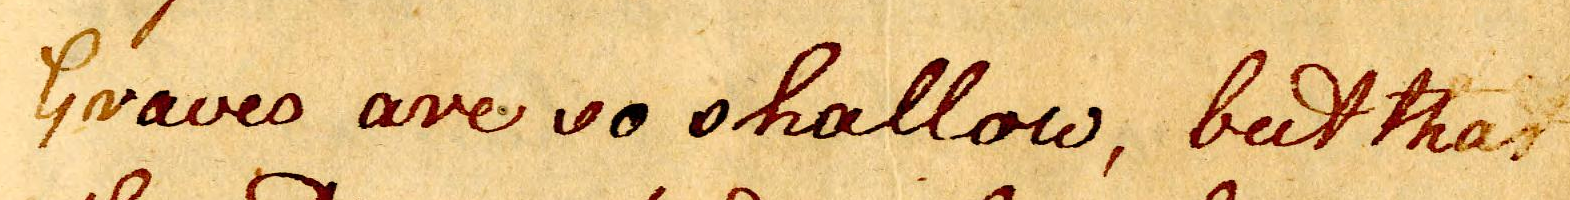Graves are so shallow, but that
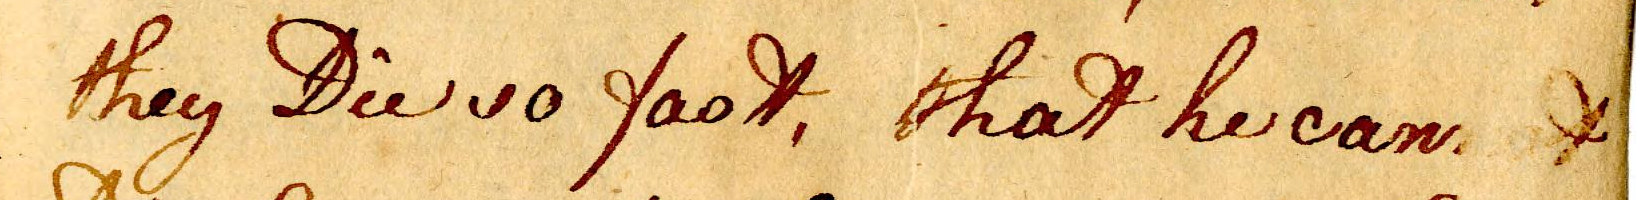they Die so fast, that he cannot
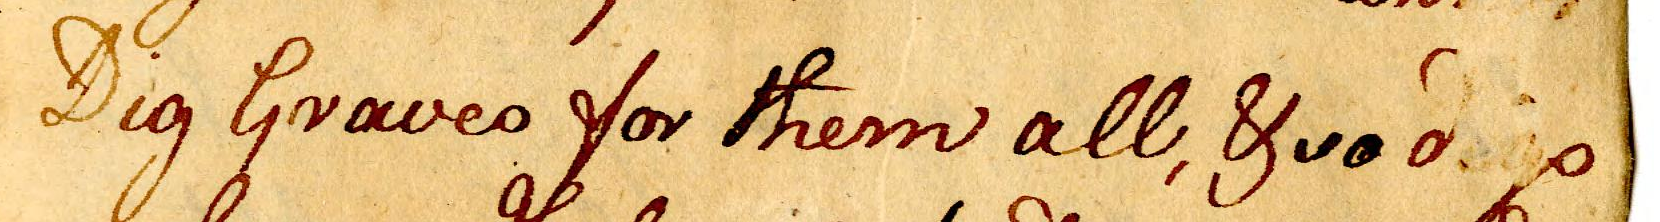Dig Graves for them all, & so digs
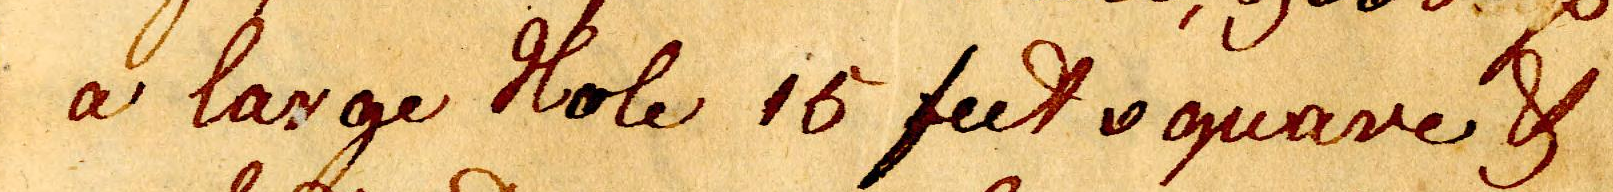a large Hole 15 feet square &
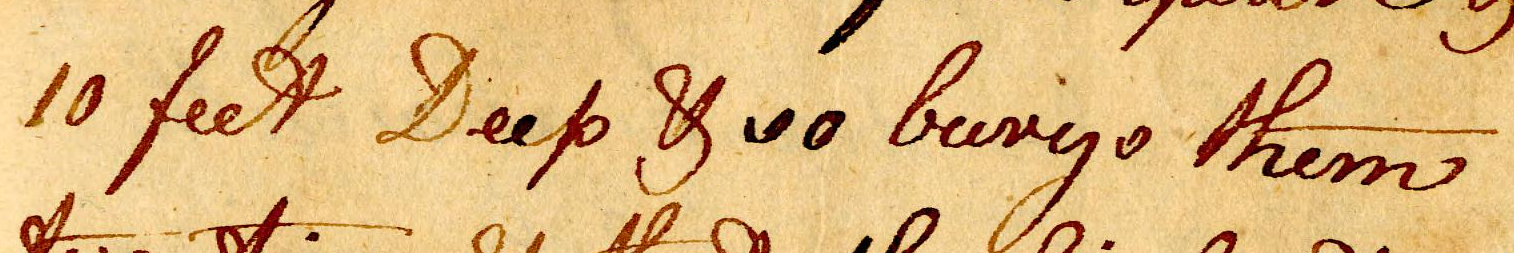10 feet Deep & so burys them
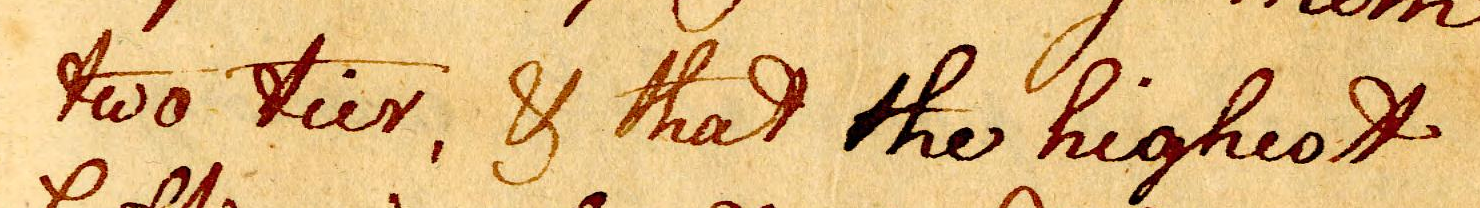two tier, & that the highest
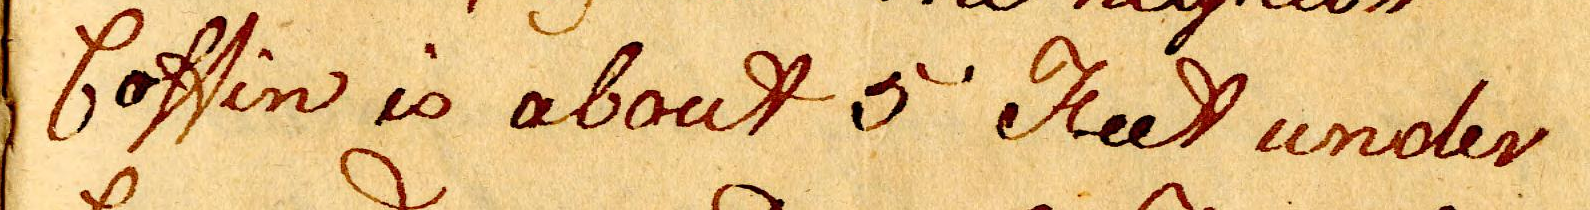Coffin is about 5 Feet under
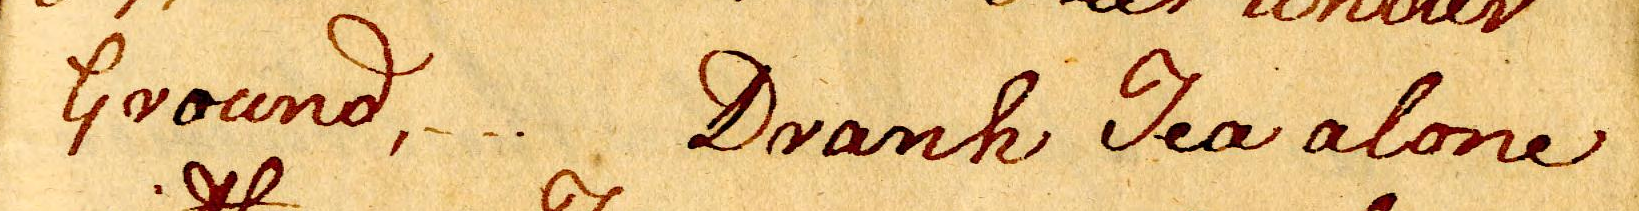Ground,- Drank Tea alone
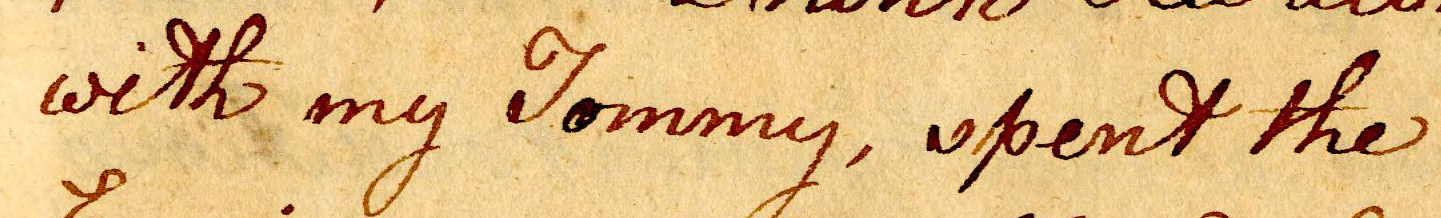with my Tommy, spent the
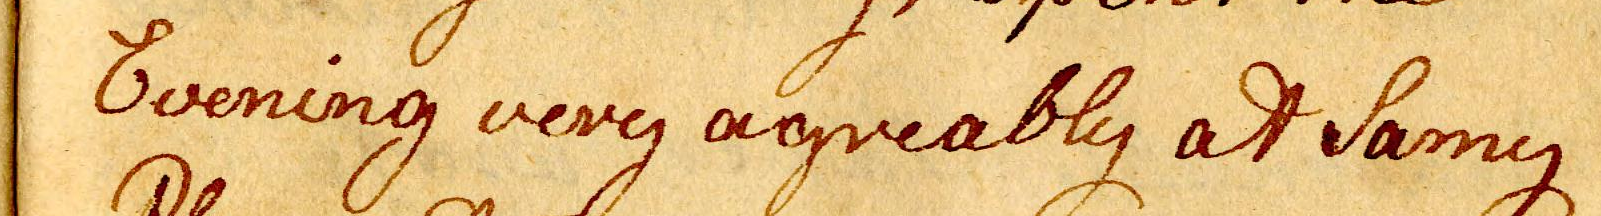Evening very agreably at Samy
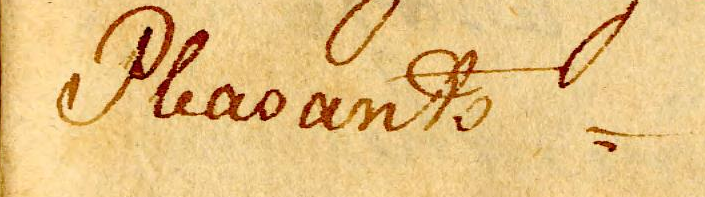Pleasants-
